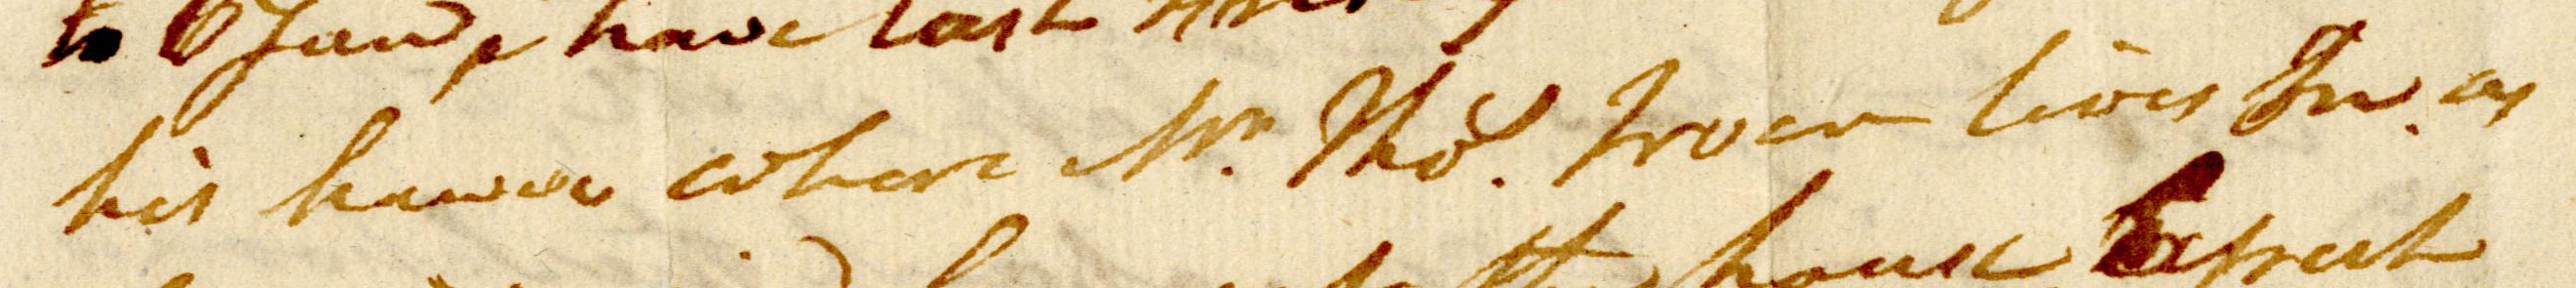his house where M^r Tho^s Fruen lives he as
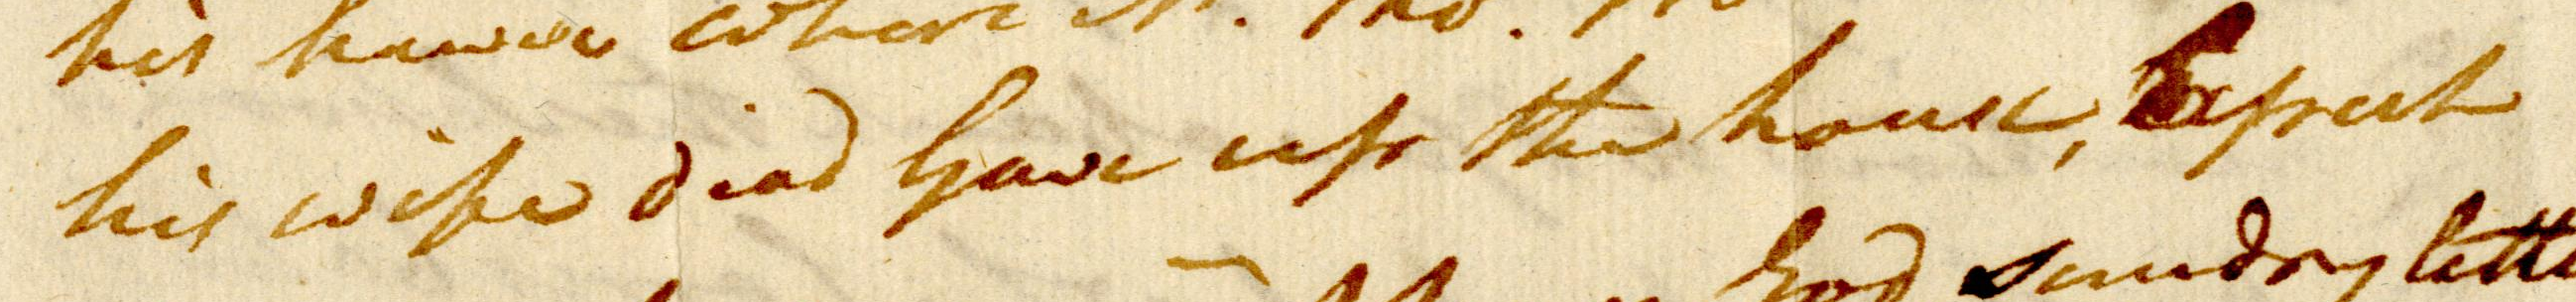his wife died Gave up the house, Expect
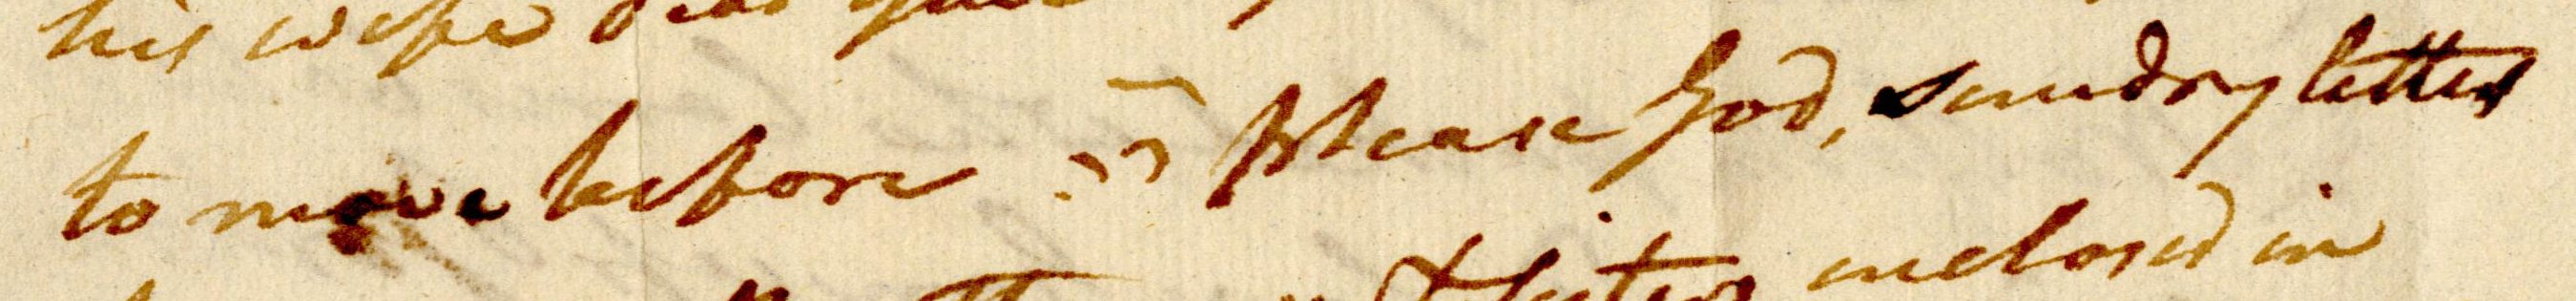to move before- please God, sundry letter
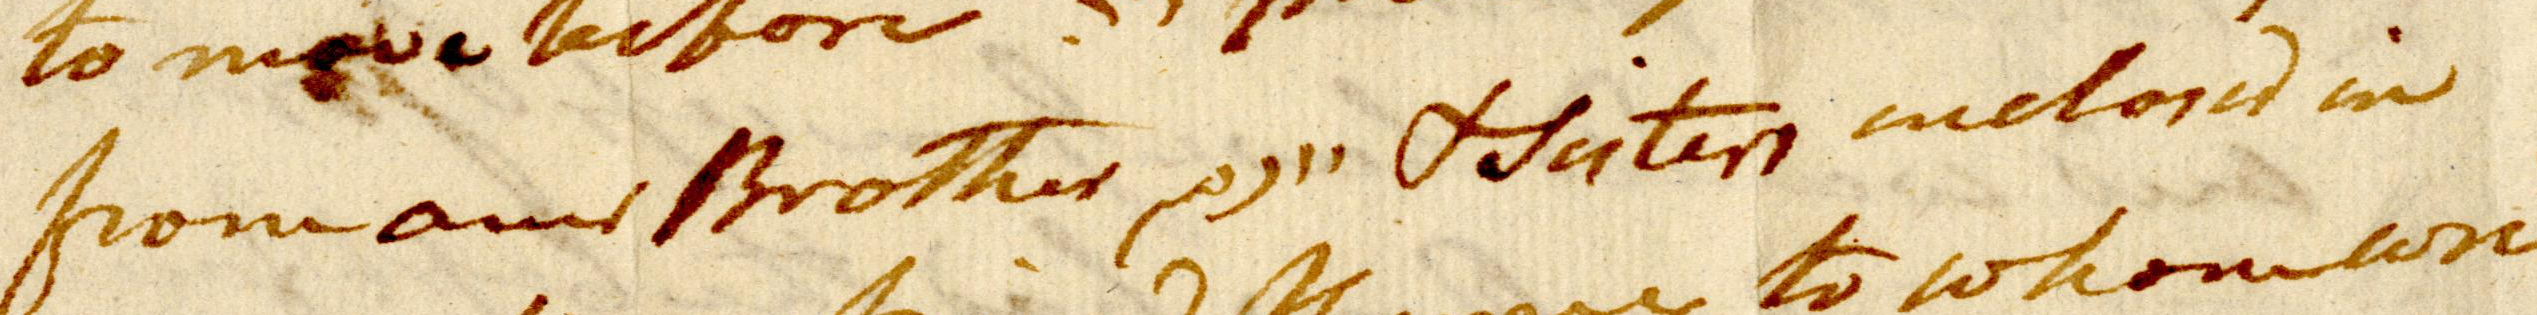from our Brothers & Sisters inclosed in
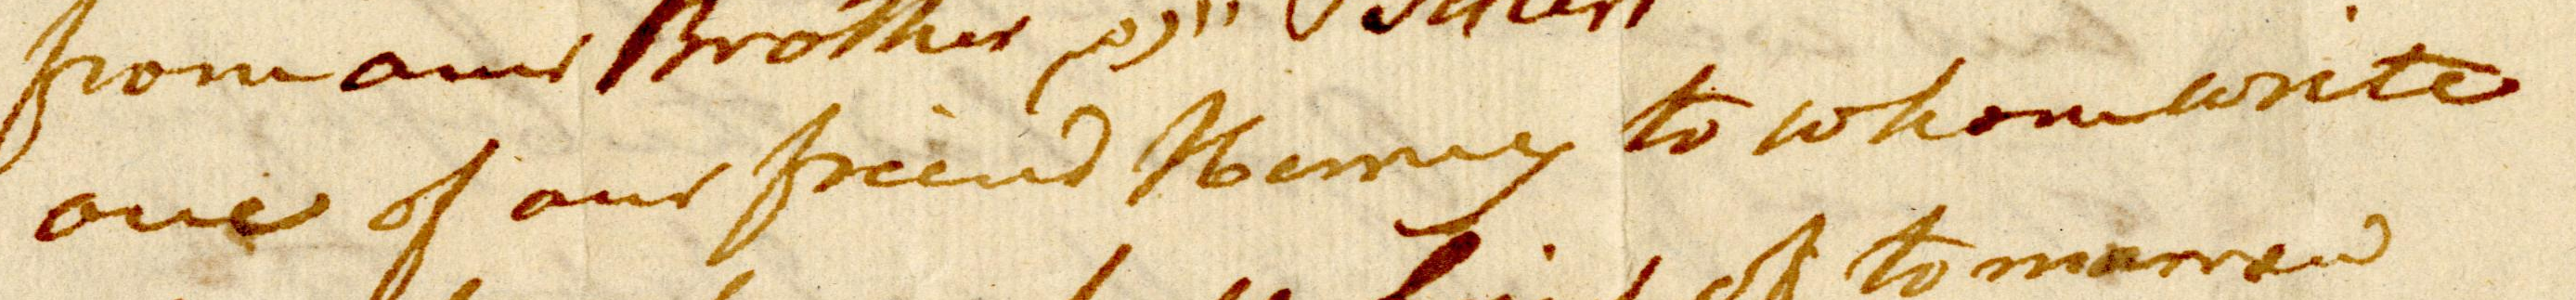one of our friend Money to whom write
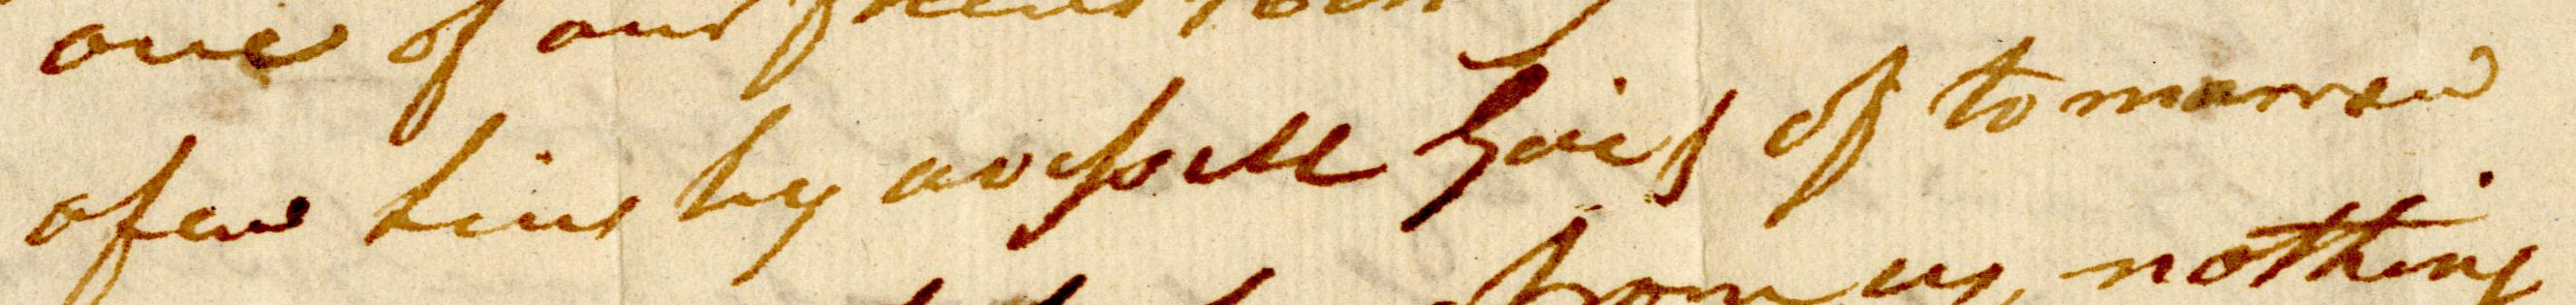a few lines by a vessell Going of tomorrow
